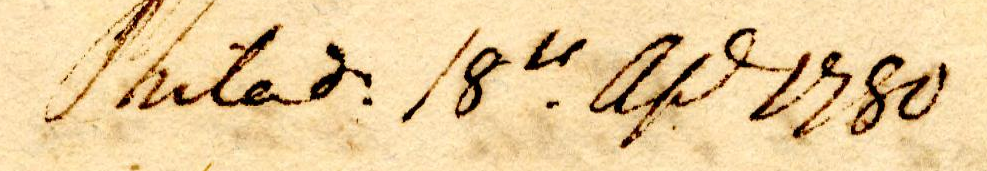Philad: 18^th. Ap^r 1780
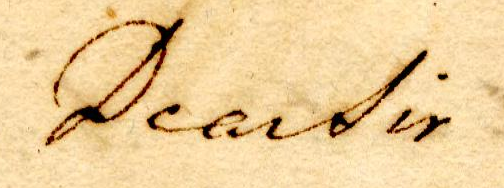Dear Sir
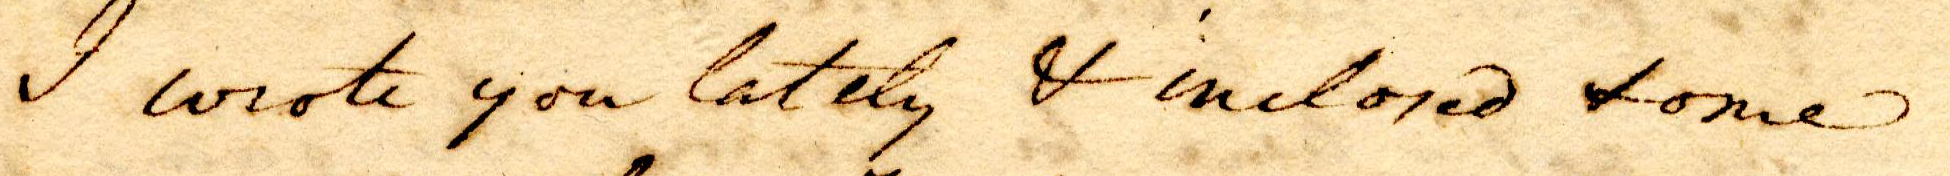I wrote you lately & inclosed some
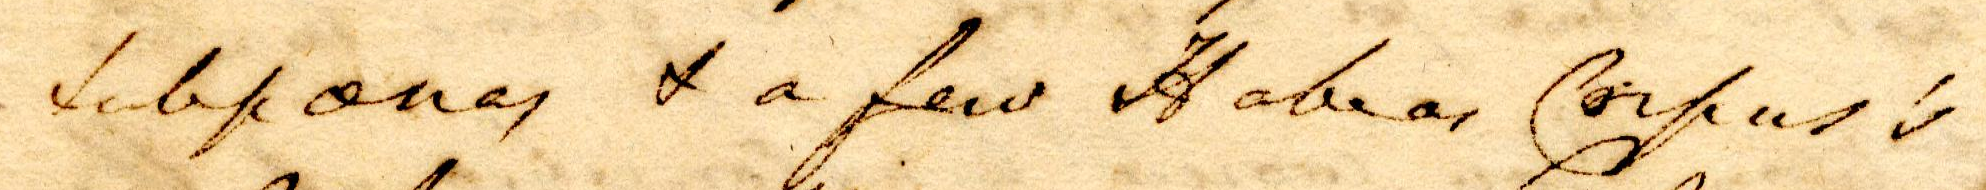Subponas & a few Habeas Corpus's
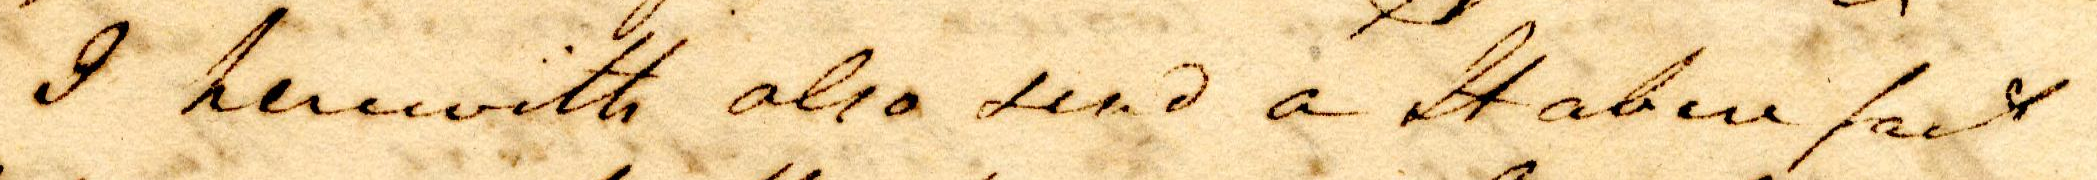I herewith also send a Stabere fact
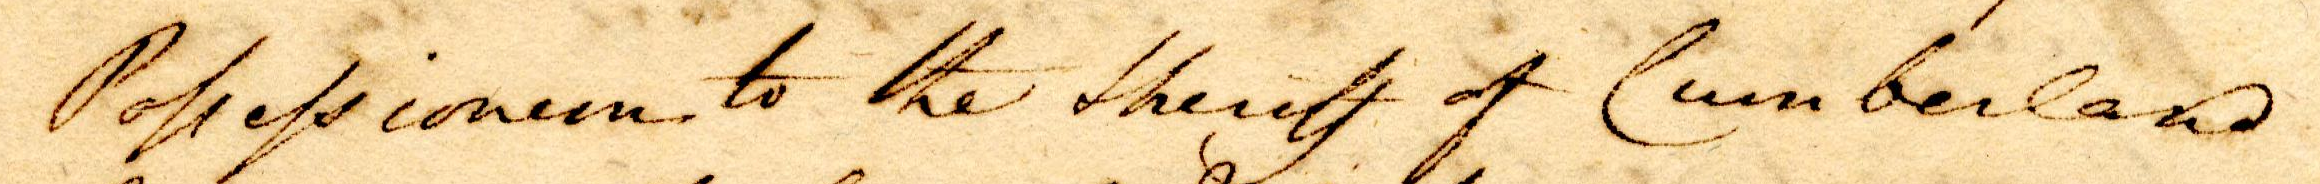Possessioneen to the sheriff of Cumberland
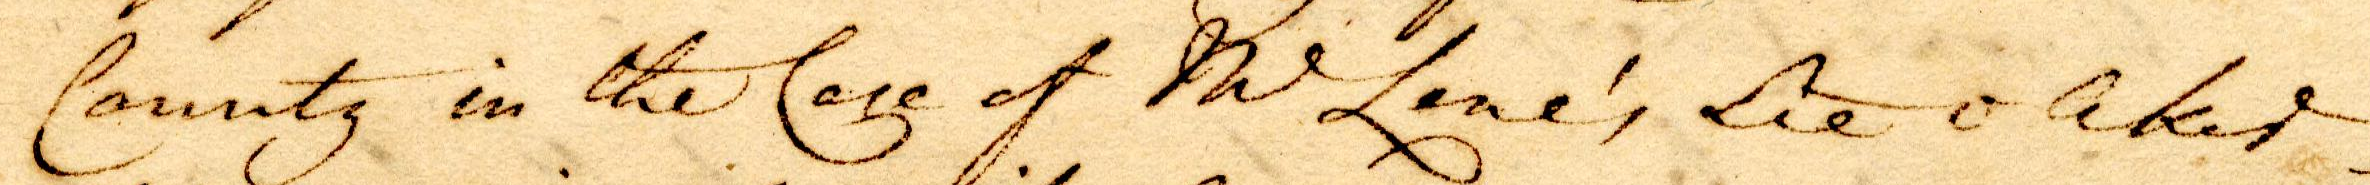County in the Case of the Lane's Lie o Aket
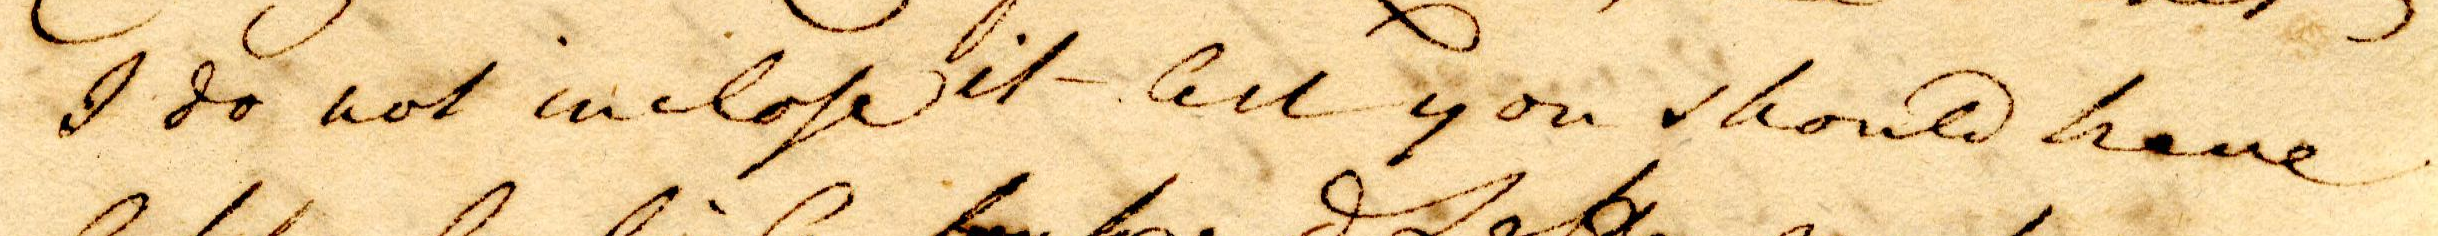I do not inclose it but you should have
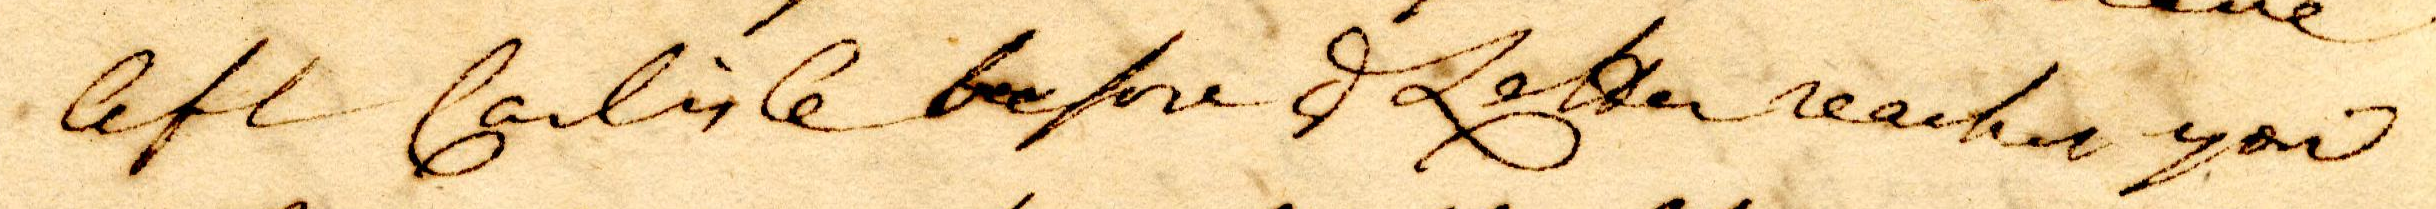left Carlisle before y^e Letter reaches you
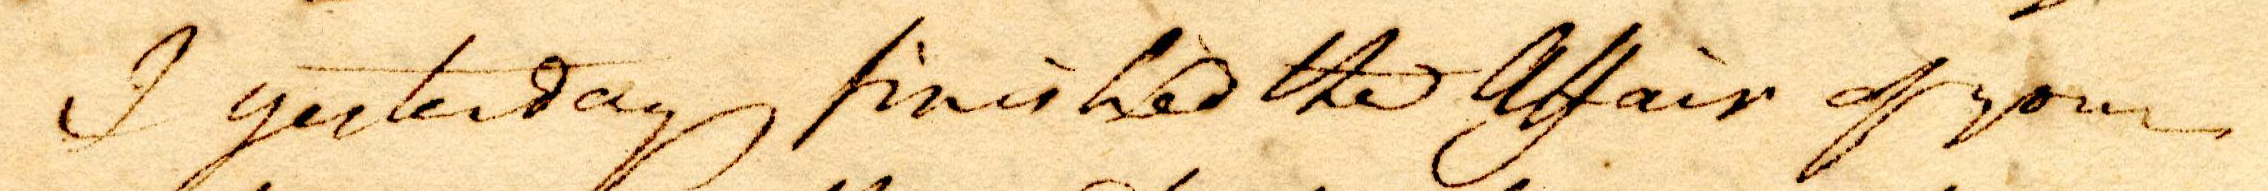I yesterday finished the Affair of your
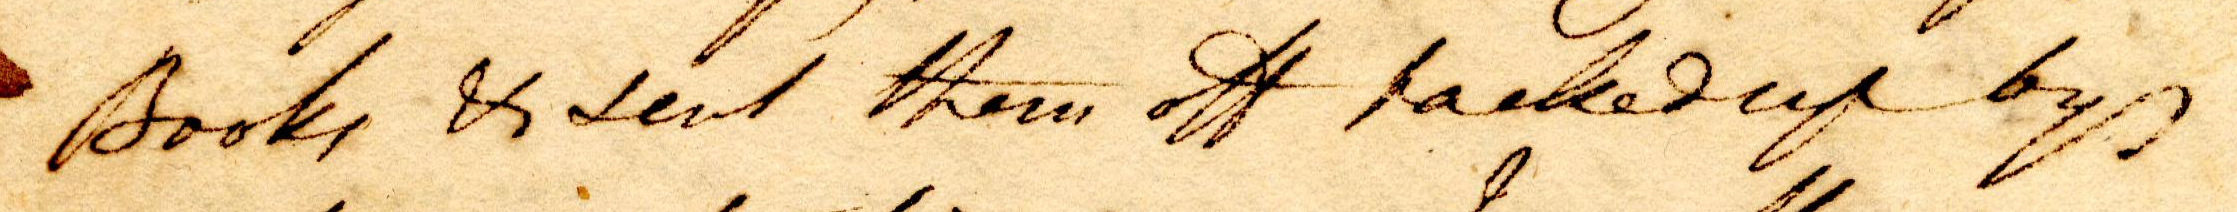Books & sent them off packed up by
